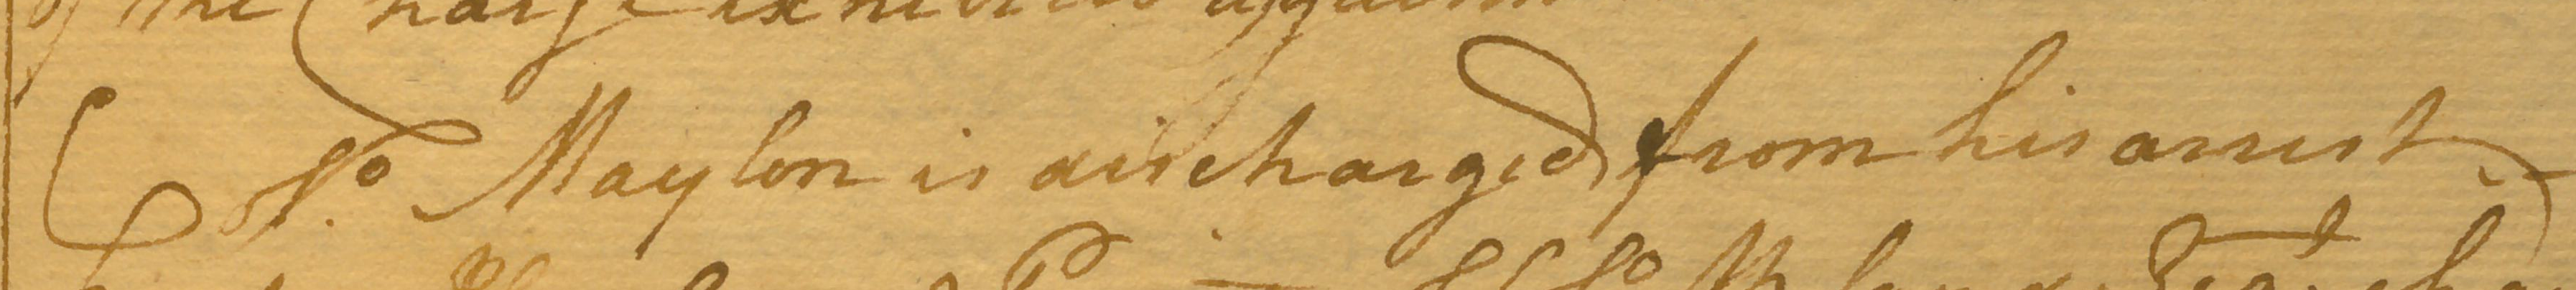Col^o. Maylon is discharged from his arrest
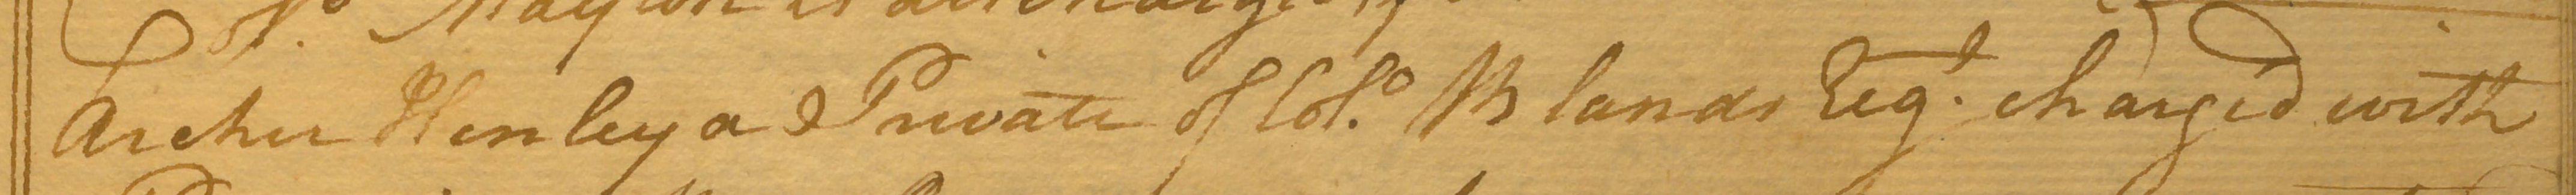Archer Henley a Private of Col^o. Blands Reg^t. charged with
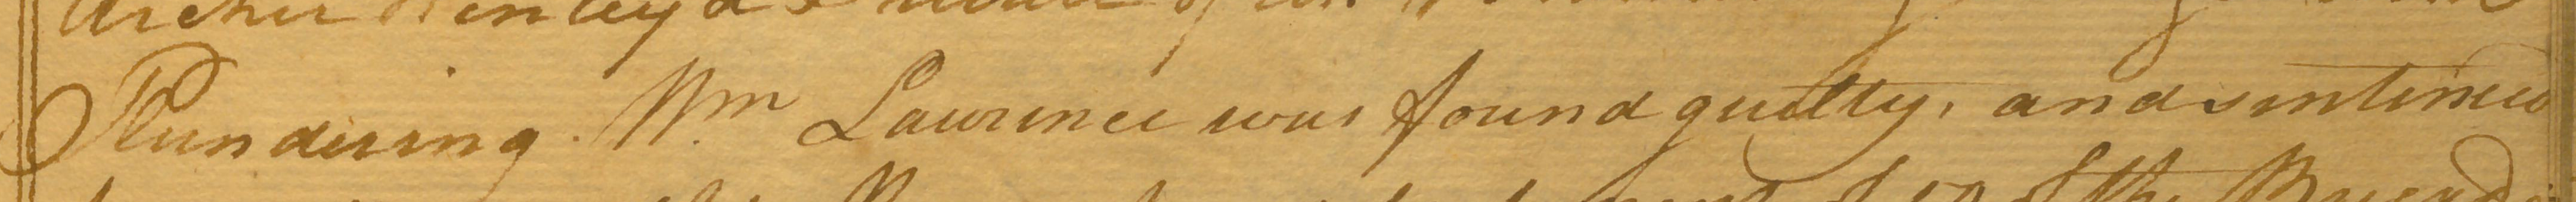Plundering. W^m. Lawrence was found guilty, and sentenced
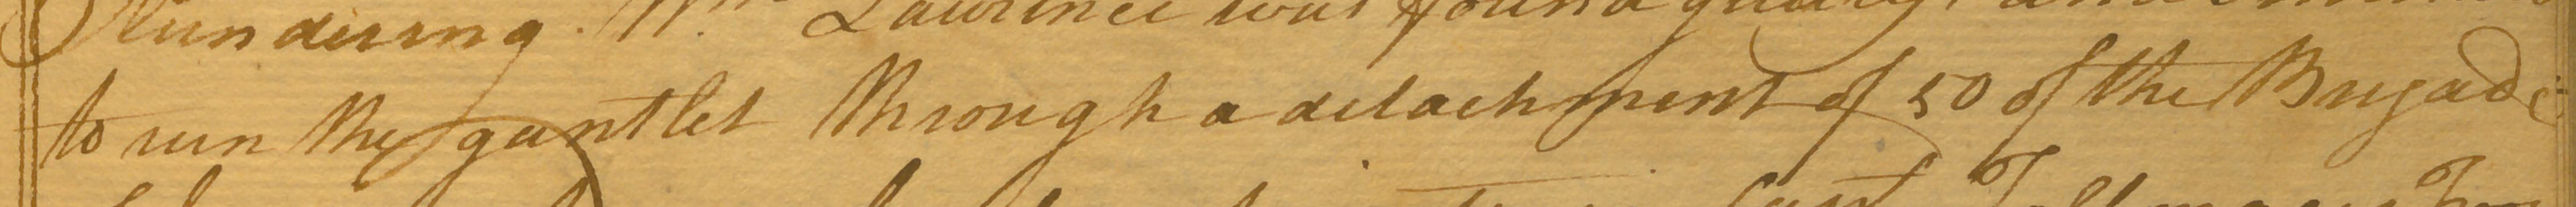to run the gantlet through a detachment of 50 of the Brigade
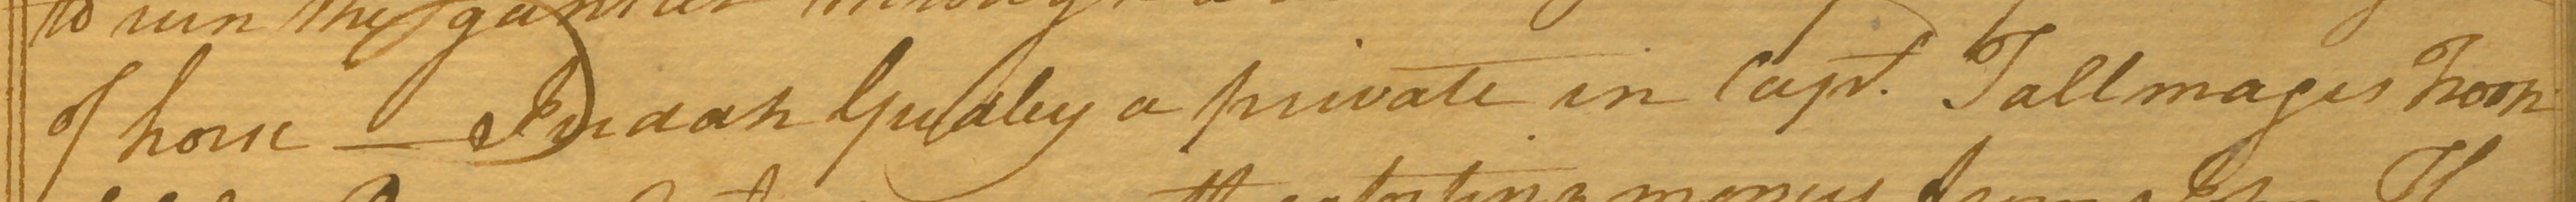of horse-Judah Gudley a private in Cap^t. Tallmages Troop
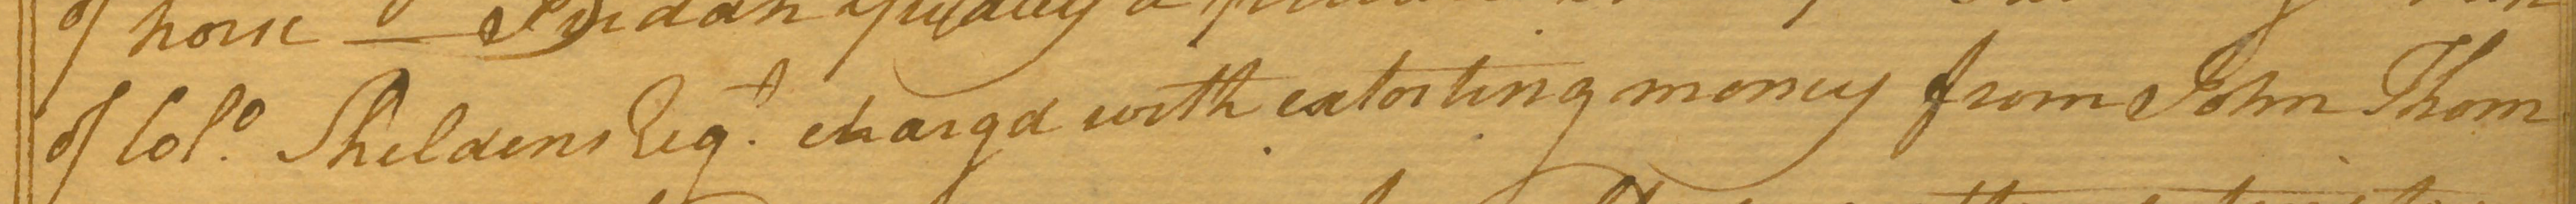of Col^o. Sheldens Reg^t. charged with extorting money from John Thom
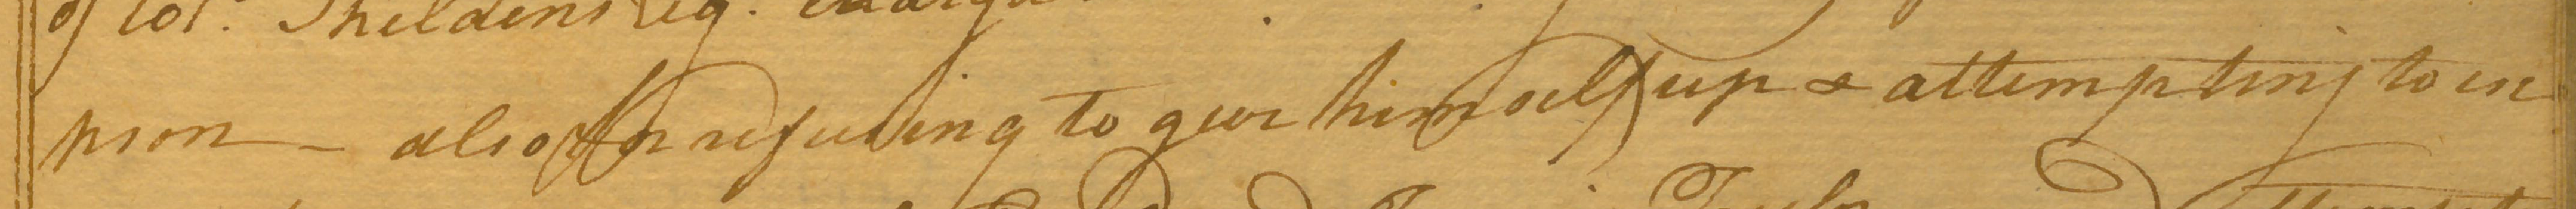pson- also for refusing to give himself up & attempting to esc
